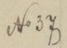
No 37
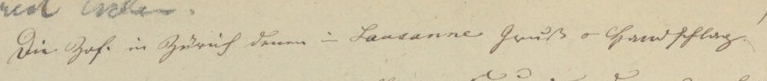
Die Zof. in Zürich denen in Lausanne Gruß & Handschlag!
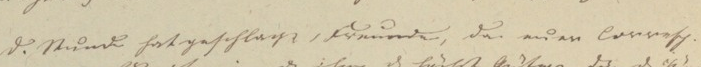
D. Stunde hat geschlagen, Freunde, da euer Corresp.
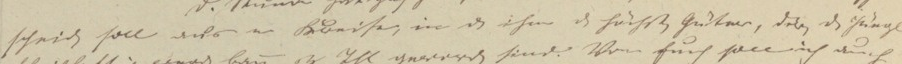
scheiden soll aus e. Kreise, in dem ihm die höchsten Güter, deren der Jüngl.
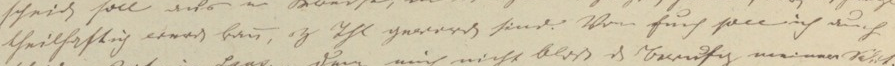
theilhaftig werden kann, z. Thl. geworden sind. Von Euch soll ich auch
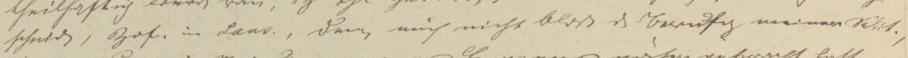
scheiden, Zof. in Laus., denen mich nicht bloß d. Berufung meiner Sekt.,
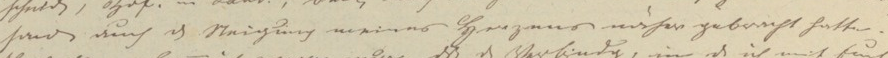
sondern auch d. Neigung meines Herzens näher gebracht hatte.
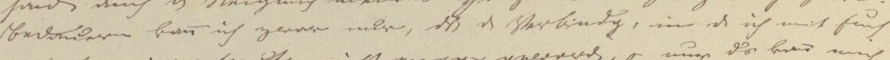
Bedauern kann ich zwar nur, dß d. Verbindung, in d. ich mit Euch
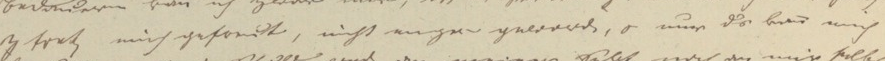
z. treten mich gefreut, nicht enger geworden, & nur ds kann mich
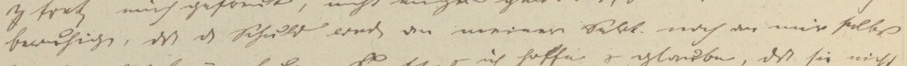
beruhigen, dß die Schuld weder an meiner Sekt. noch an mir selbst
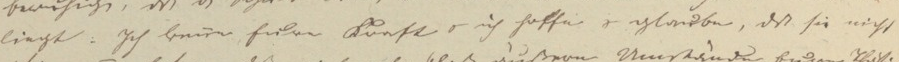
liegt. Ich kenne Eure Kraft & ich hoffe & glaube, dß sie nicht
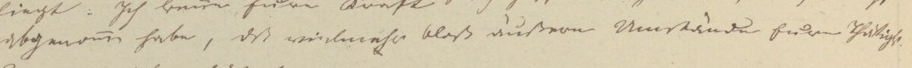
abgenommen habe, dß vielmehr bloß äußere Umstände Eure Thätigk.
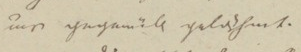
uns gegenüber gelähmt.
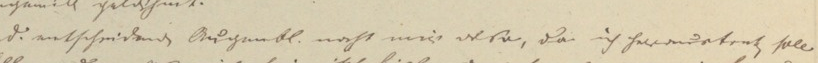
D. entscheidende Augenbl. naht mir also, da ich heraustreten soll
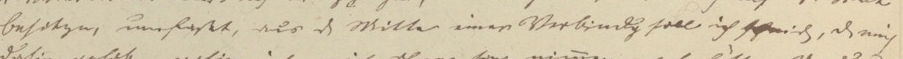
besitze, umfaßt, aus der Mitte einer Verbindung soll ich scheiden, die mich
